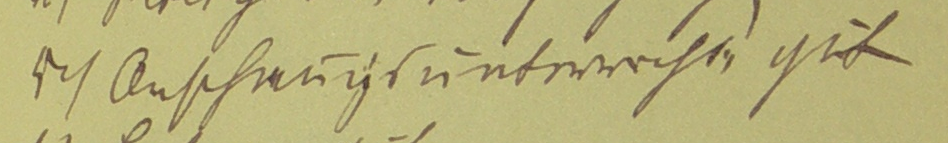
5. Anschaungsunterricht gut
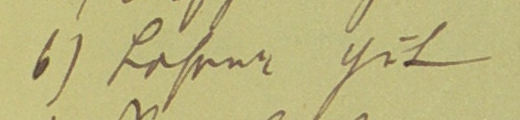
6. Lesen gut
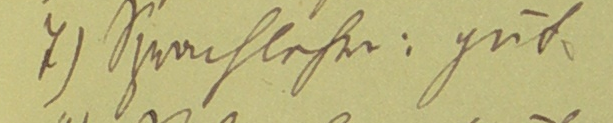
7. Sprachlehre gut
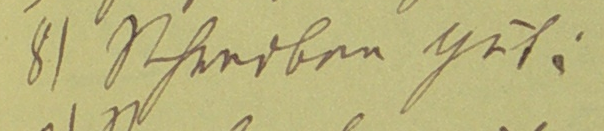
8. Schreiben: gut
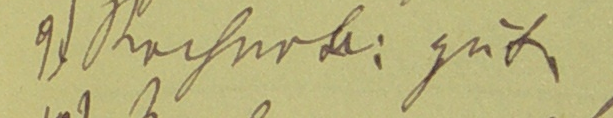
9. Rechnen: gut
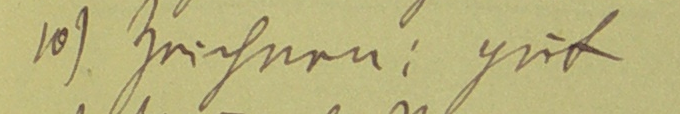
10. Zeichnen: gut
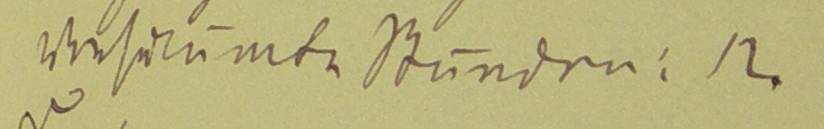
Versäumte Stunden: 12
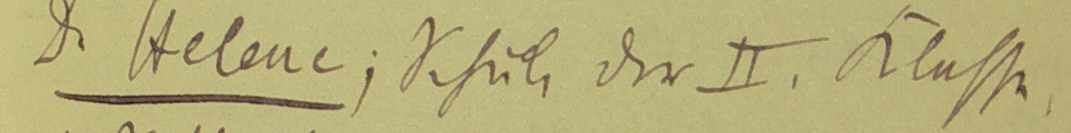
D. Helene.. Schülerin der II klasse
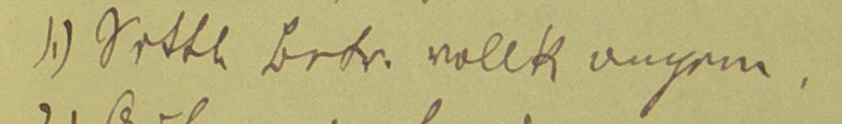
1. Sittl. Betragen vollkommen angemessen
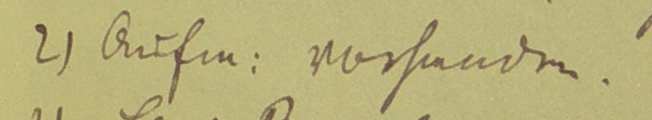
2. Aufmerks. vorhanden
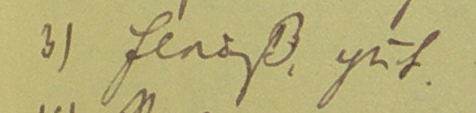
3. Fleiß: gut
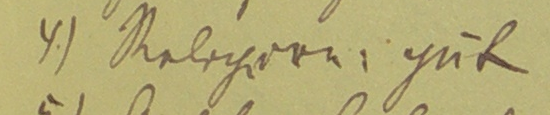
4. Religion: gut
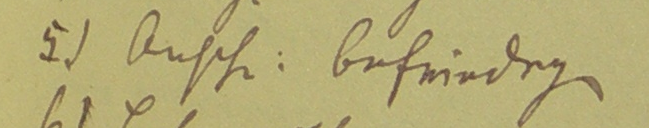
5. Anschaungs.: befriedigend
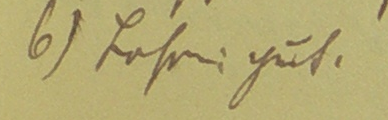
6. Lesen gut
